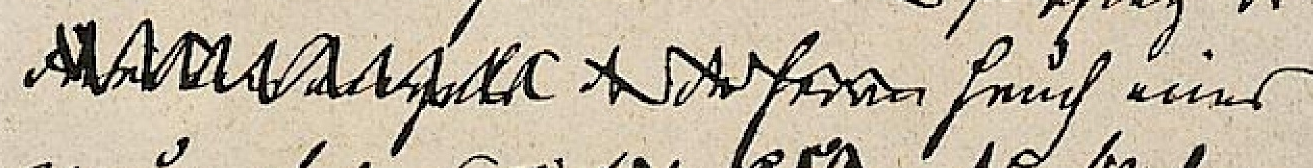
dere eesealt ür der ferne Hauch eines
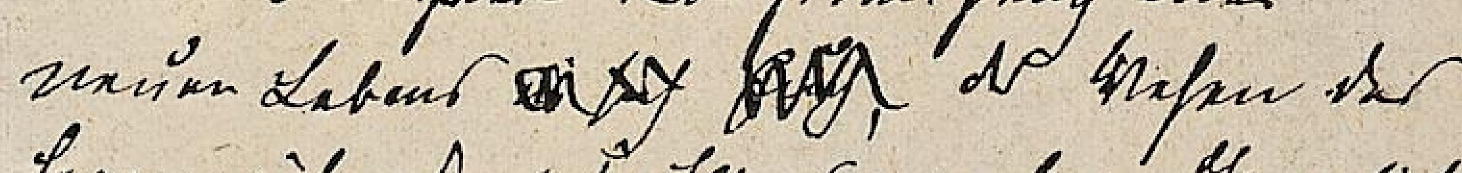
neuen Lebens es sich Euch, ds Wesen des
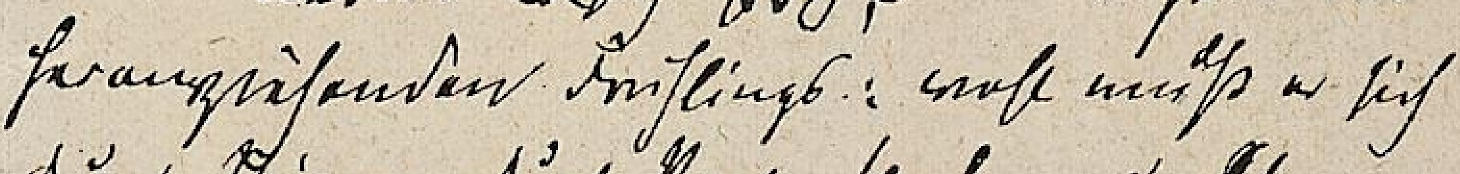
heranziehenden Frühlings: wohl muß er sich
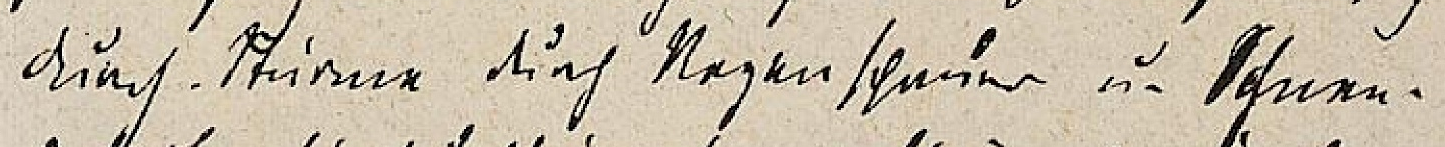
durch. Stürme, durch Regenschauer u. Schnee¬
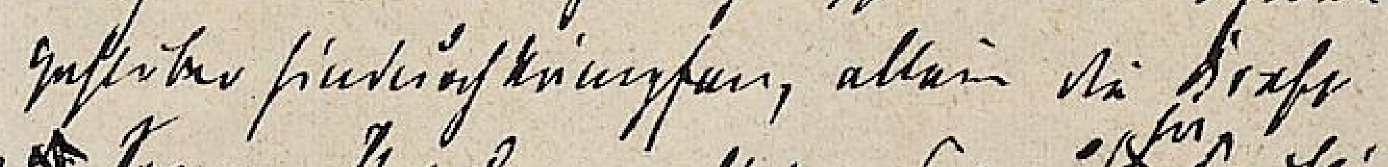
gestöber hindurchkämpfen, allein, die Kraft
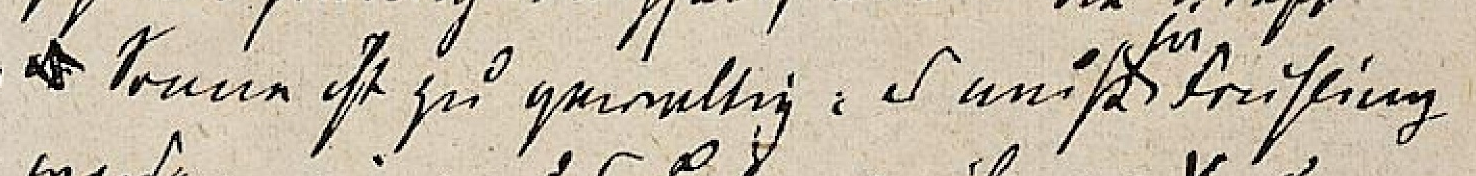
dr Sonne ist zu gewallig: es muß ja Frühling
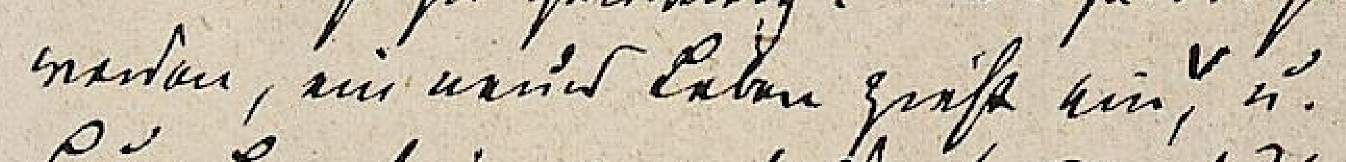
werden, ein neues Leben zieht ein, u.
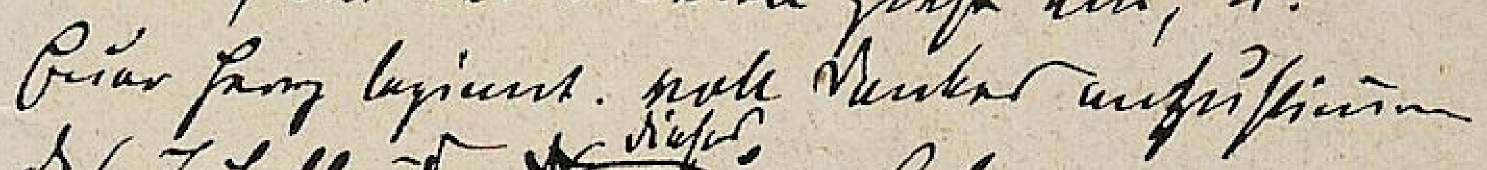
Euer Herz beginnt. voll Dankes anzustimen
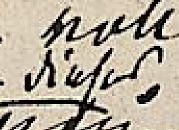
dieses
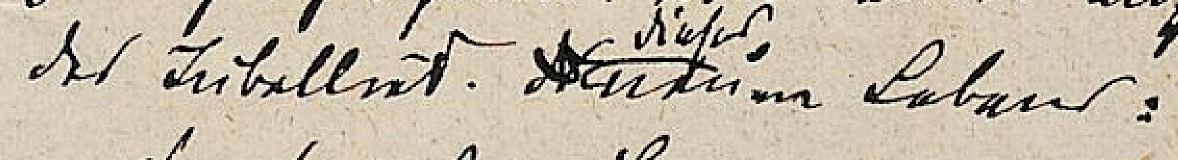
das Jubellied, des neuen Lebens:
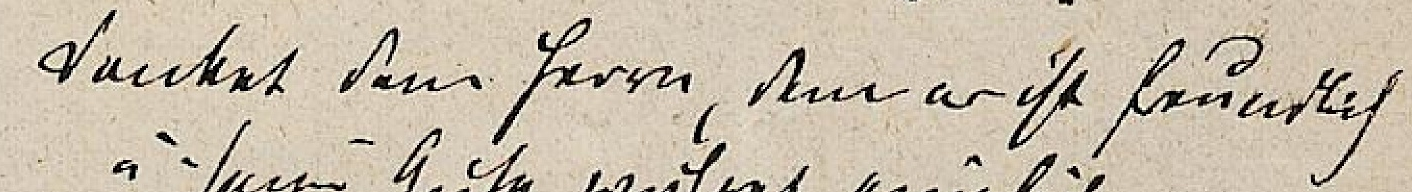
Danket dem Herrn, denn er ist freundlich
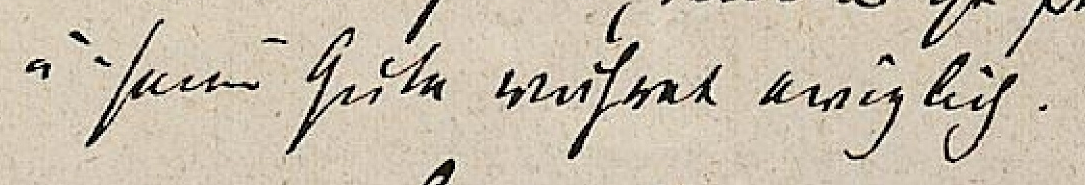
u. seine Güte währet ewiglich.
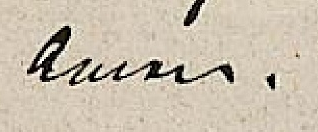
Amen
